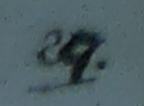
29.
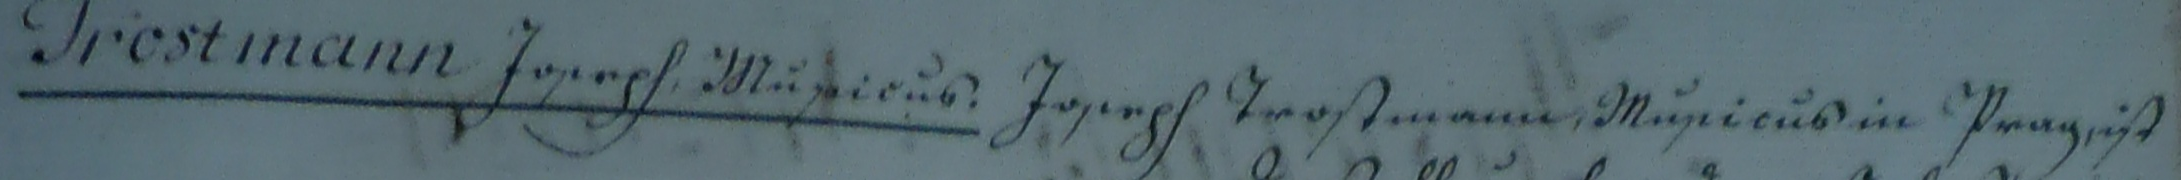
Trostmann Joseph, Musicus. Joseph Trostmann, Musicus in Prag, ist
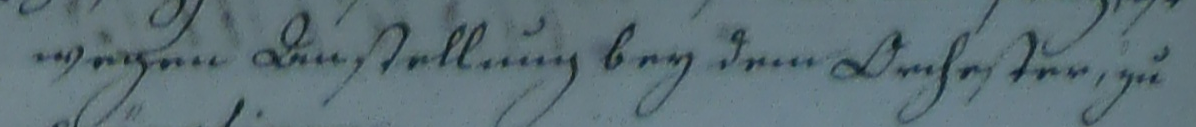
wegen Anstellung bey dem Orchester, zu
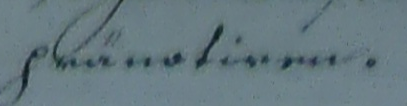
pränotiren.
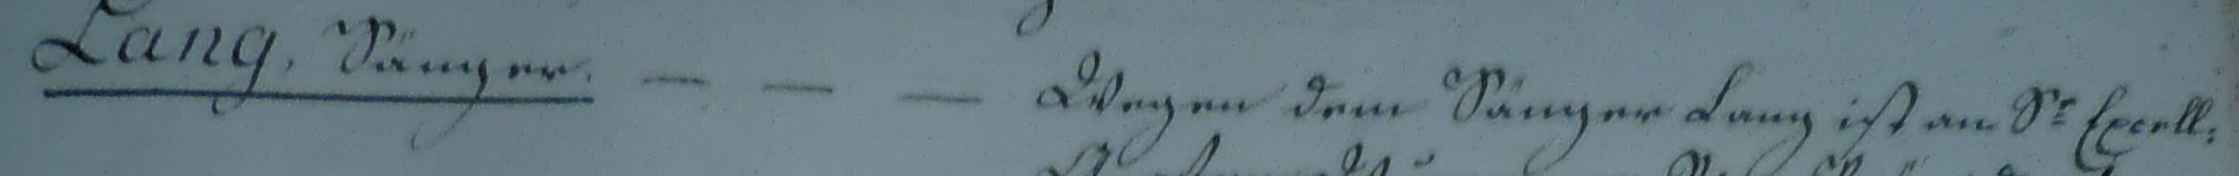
Lang, Sänger. _ _ _ Wegen dem Sänger Lang ist an Se͇ Excell:
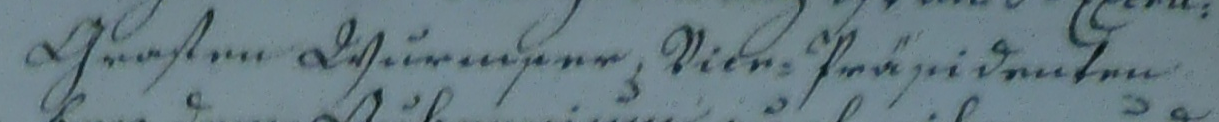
Grafen Wurmser, Vice=Präsidenten
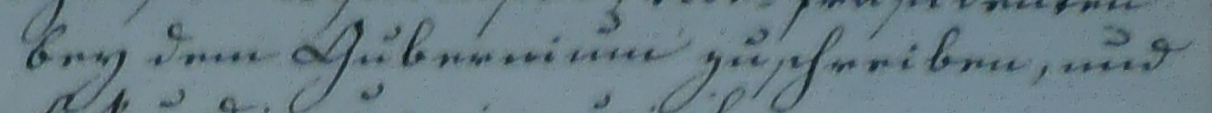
bey dem Gubernium zuschreiben, und
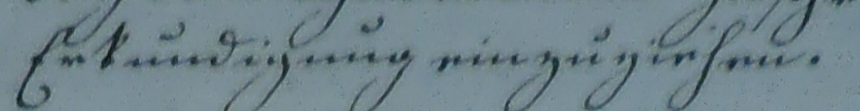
Erkundigung einzuziehen.
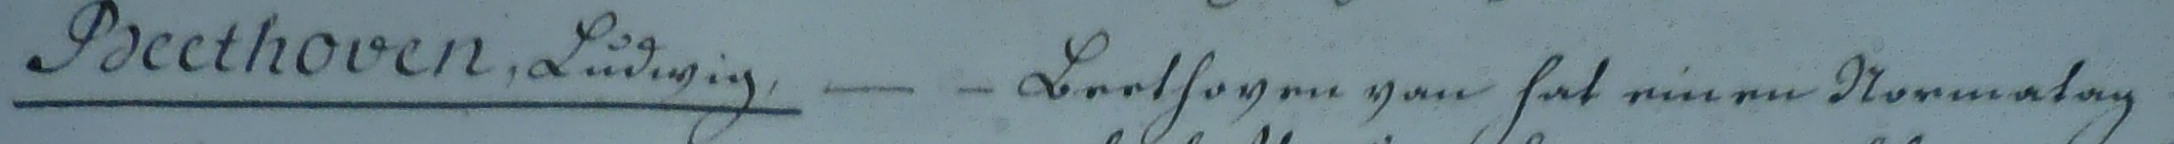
Beethoven, Ludwig, _ _ Beethoven van hat einen Normatag
